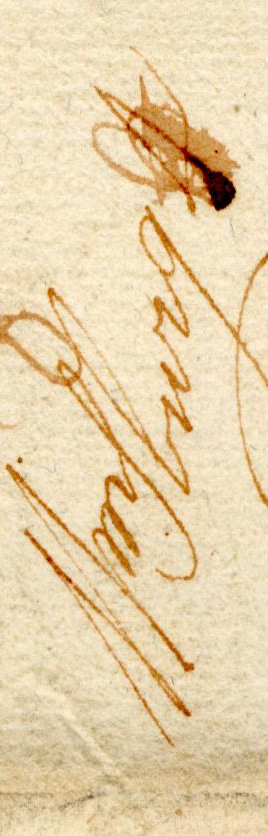WmBurg
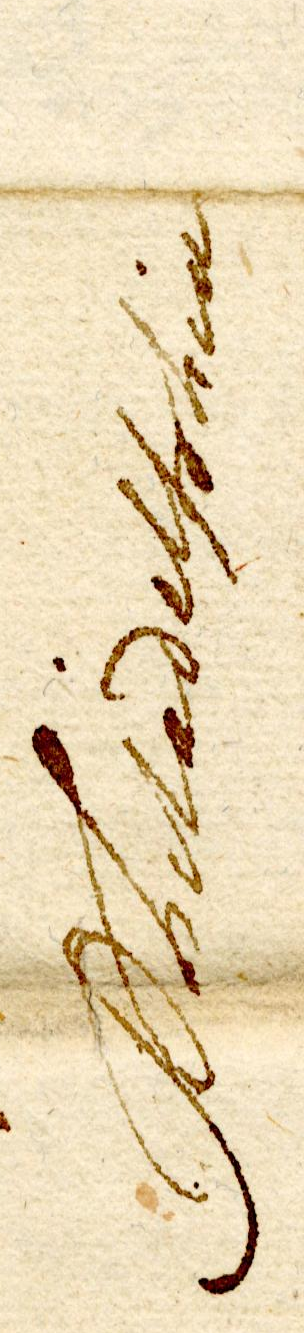Philadelphia
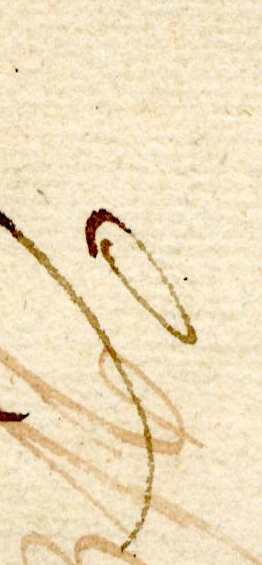To
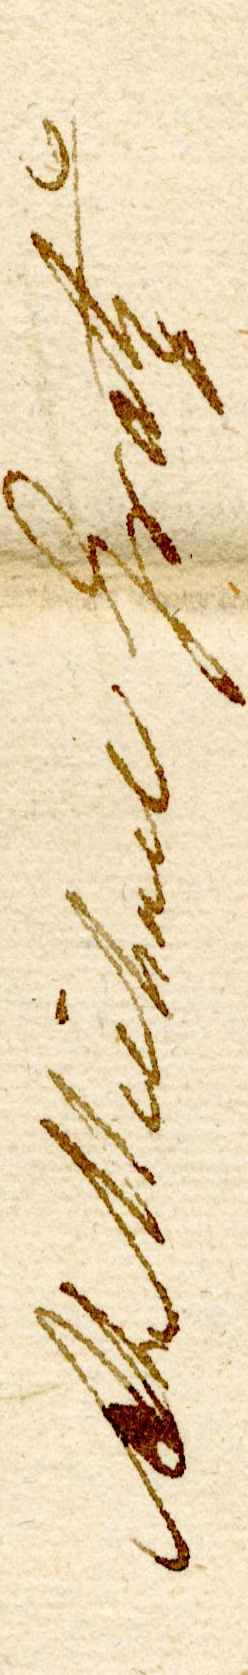At Michael Gratz
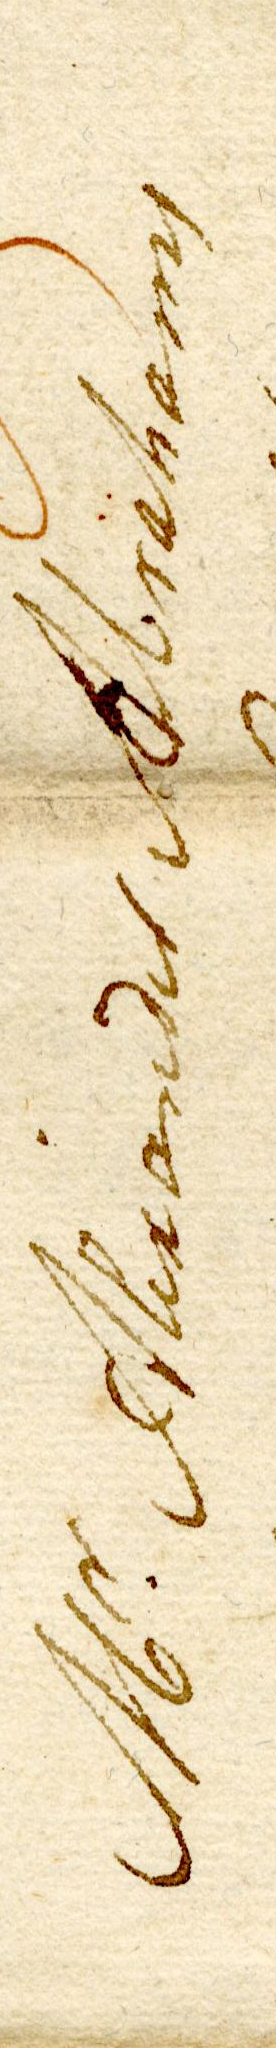M^r Alexander Abraham
